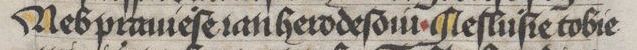Neb prauíeẛe ian herodeſowi.Neſluẛie tobie
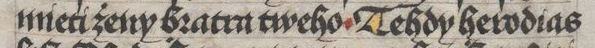mieti żeny bratra tweho.Tehdy herodias
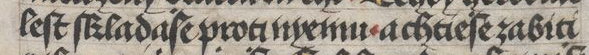leſt ſkladaẛe proti nyemu.a chtíeẛe zabiti
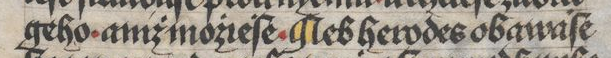geho.aniż możieẛe.Neb herodes obawaẛe
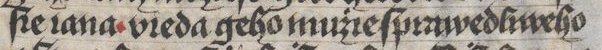ſie iana vieda geho mużie ſprawedliweho
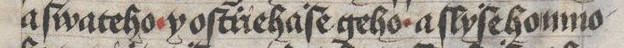a ſwateho y oſtṙiehaẛe geho.a ſlyẛe ho mno¬
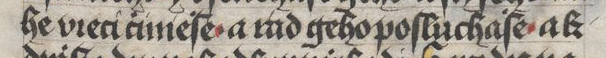he vieci ċiníeẛe.a rad geho poſluchaẛe.a k¬
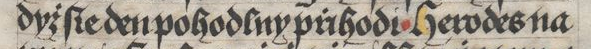dyż ſie den pohodlny pṙihodi.Herodes na¬
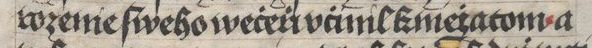rozenie ſweho weċeṙi uċinil kníeżatom.a
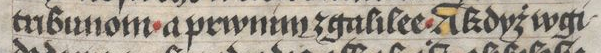tribunom.a prwním z galilee.A kdyż wgí¬
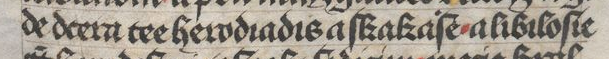de dcera te herodiadis a ſkakaẛe.a libilo ſie
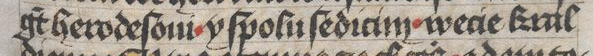ḡt herodeſowi y ſpolu ſedícím.wecie kral
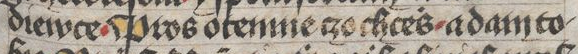diewce.Pros ote mnie czo chceṡ.a dam to¬
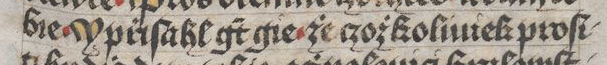bie y pṙiſahl ḡt gie.że czoż koliviek proſi¬
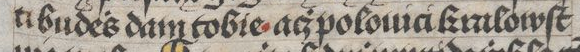ti budeṡ dam tobie.acż polouici kralowſt¬
